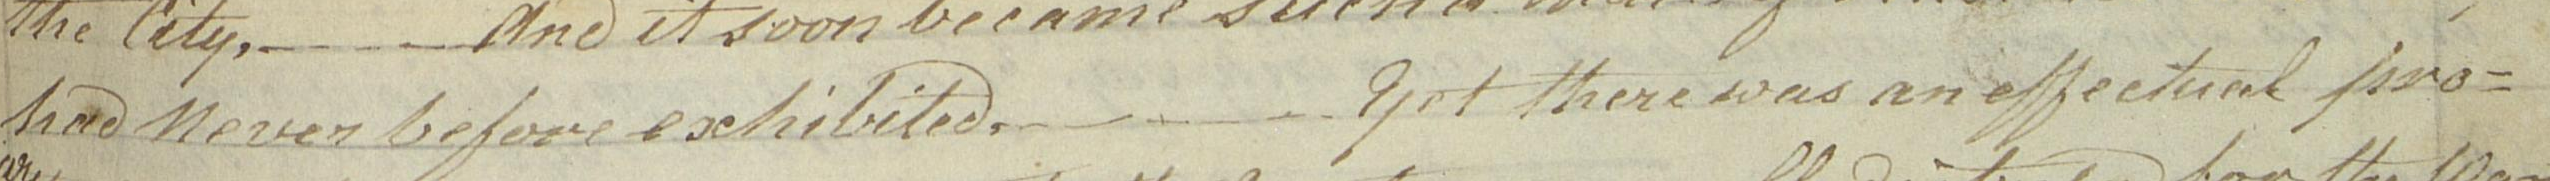had Never before exhibited. Yet there was an effectual pro-
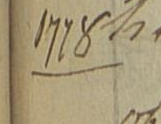1778
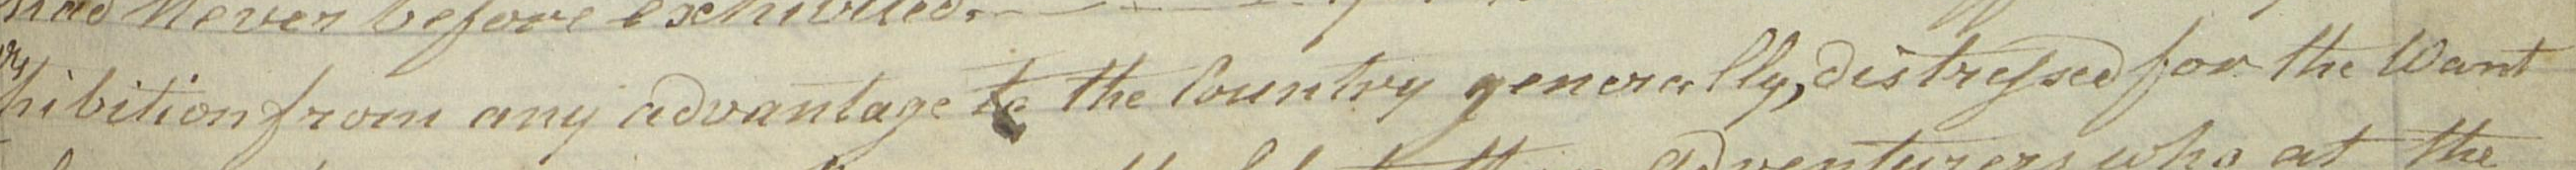hibition from any advantage to the Country generally, distressed for the Want
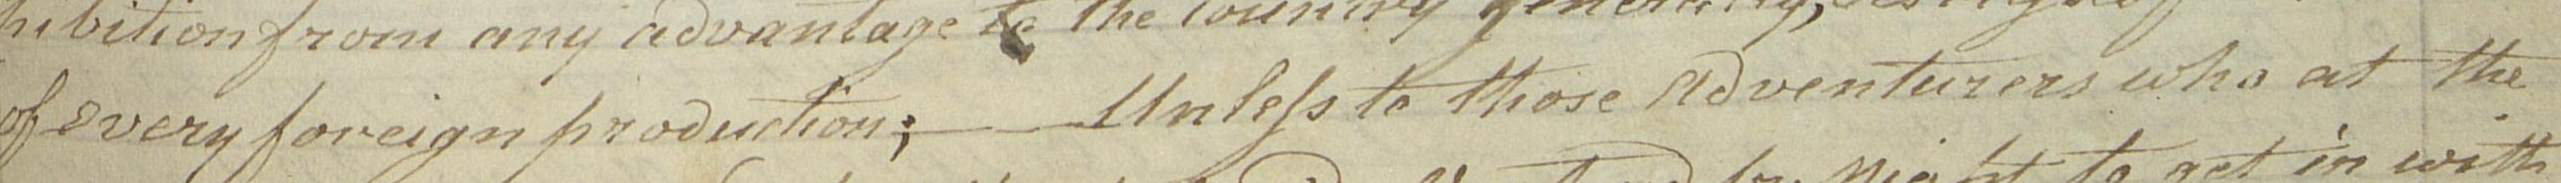of every foreign production; Unless to those adventures who at the
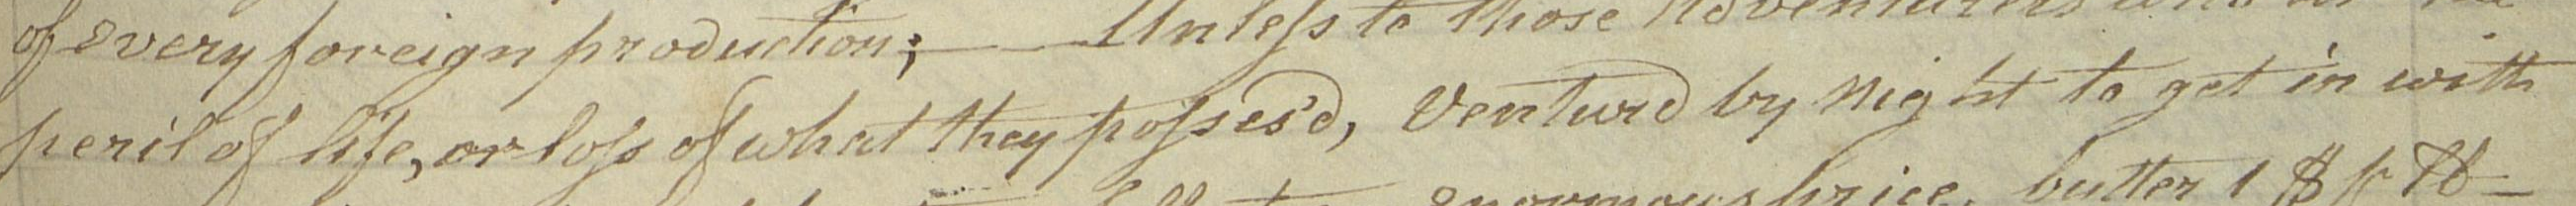peril of life, or loss of what they posses'd, Venturd by night to get in with
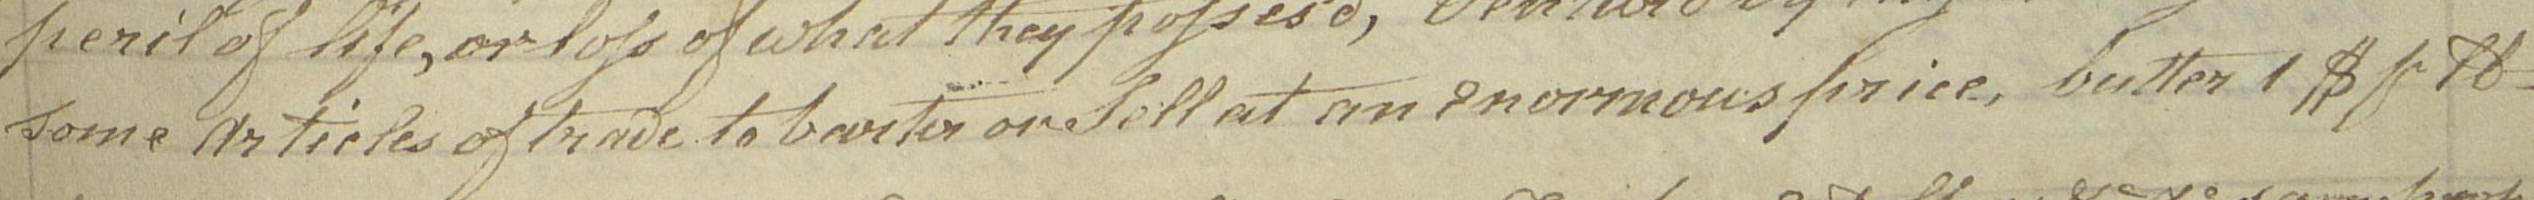some articles of trade to barter on Sell at an enormous price, butter 1 $ per lb
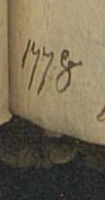1778
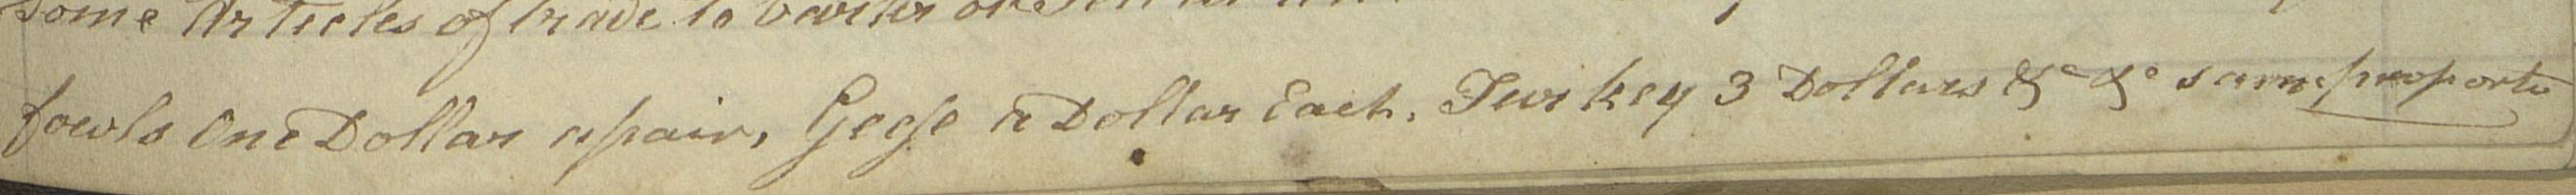fowls One Dollar a pair, Geese a Dollar Each, Turkey 3 Dollars &^c &^c. same proporte
